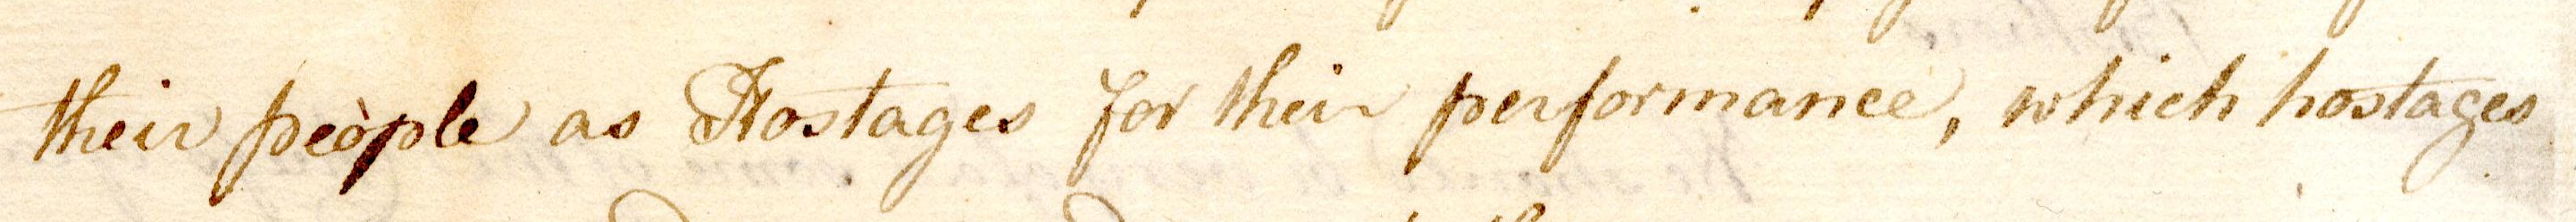their people as Hostages for their performance, which hostages
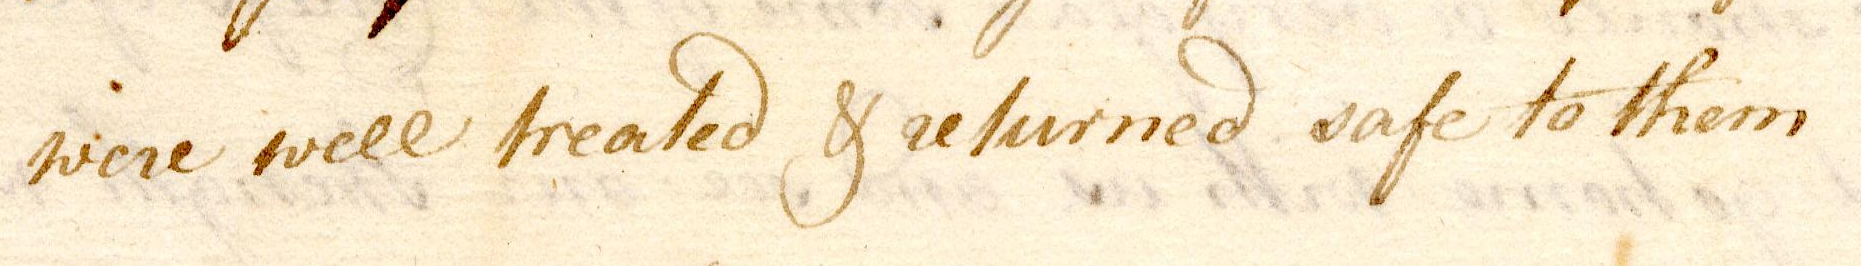were well treated & returned safe to them
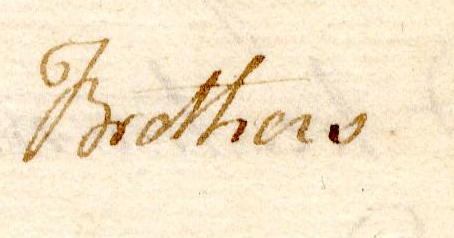Brothers
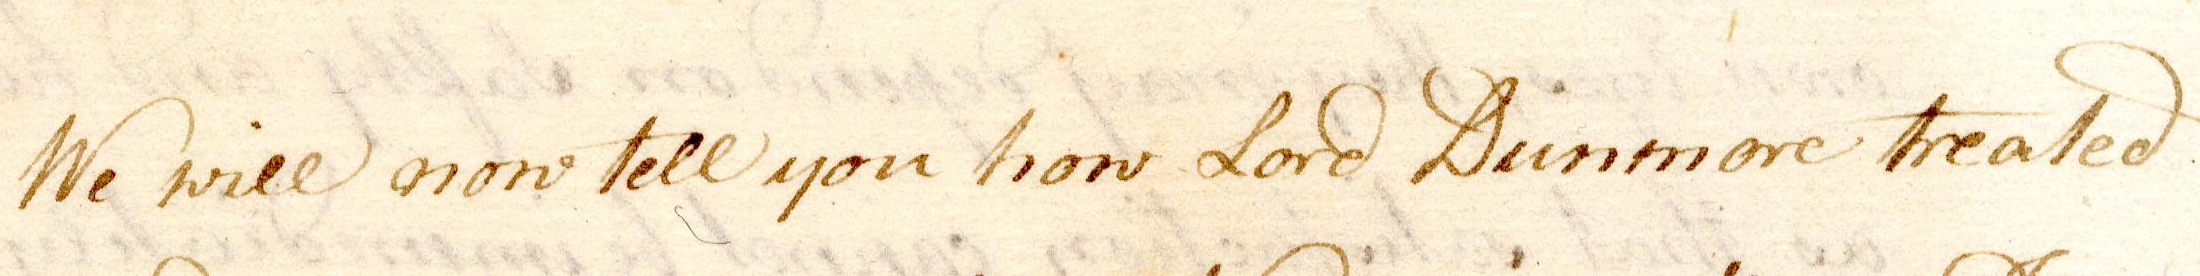We will now tell you how Lord Dunmore treated
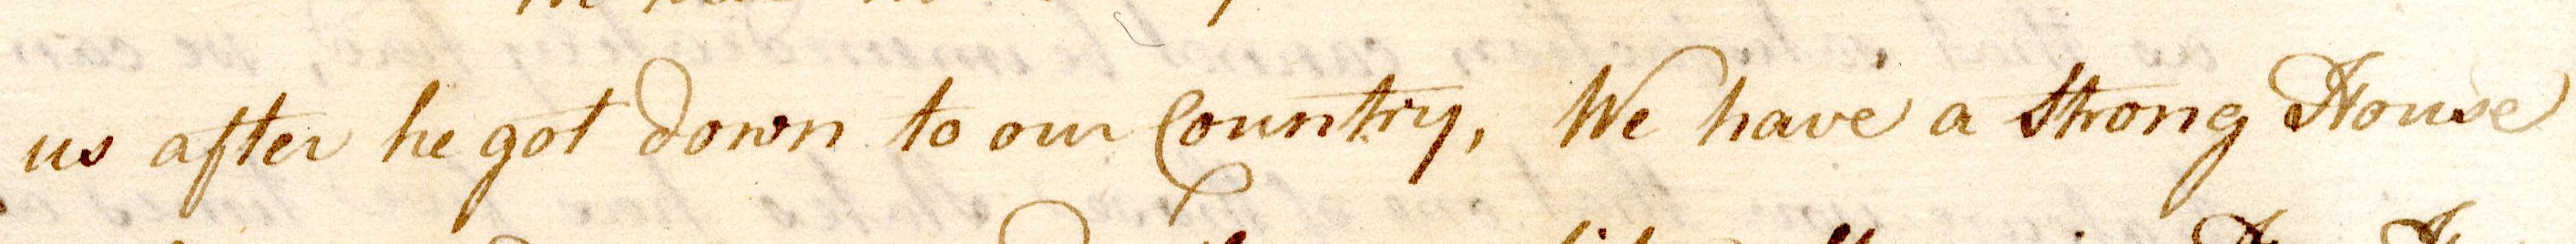us after he got down to our Country, We have a Strong House
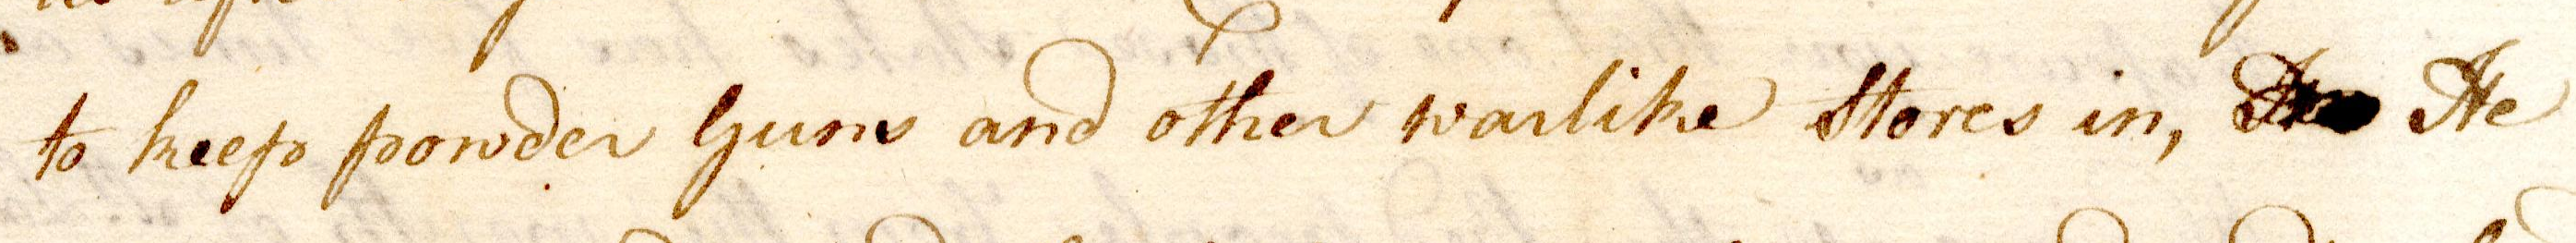to keep powder Guns and other warlike Stores in, [__]He
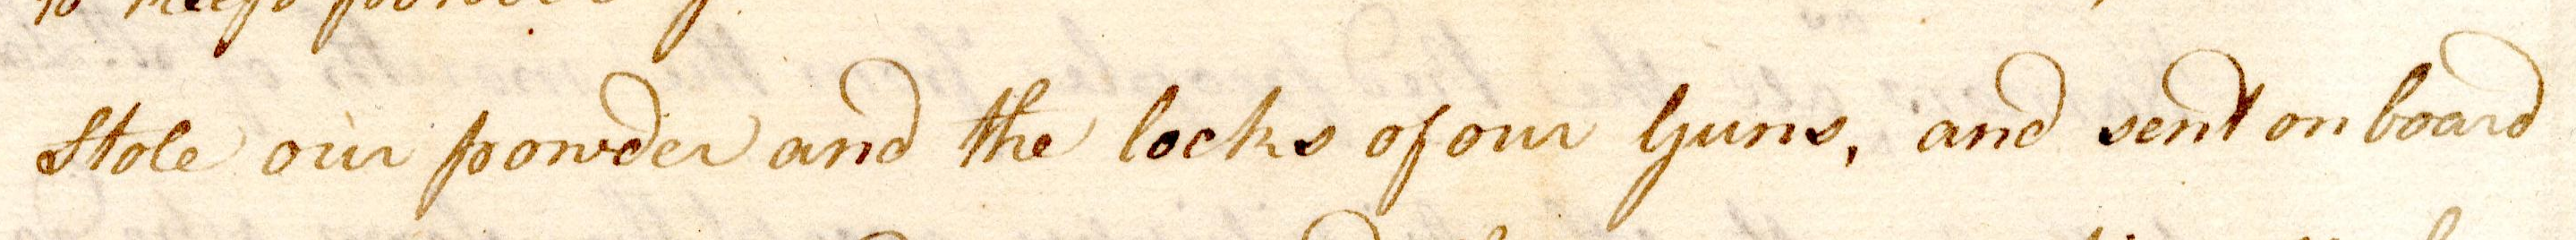Stole our powder and the locks of our Guns, and sent on board
